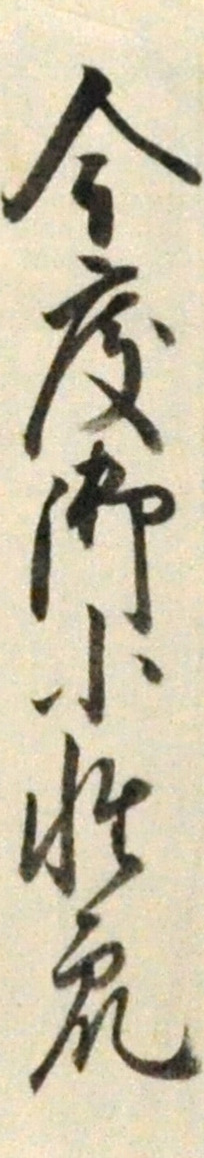今度御小性衆
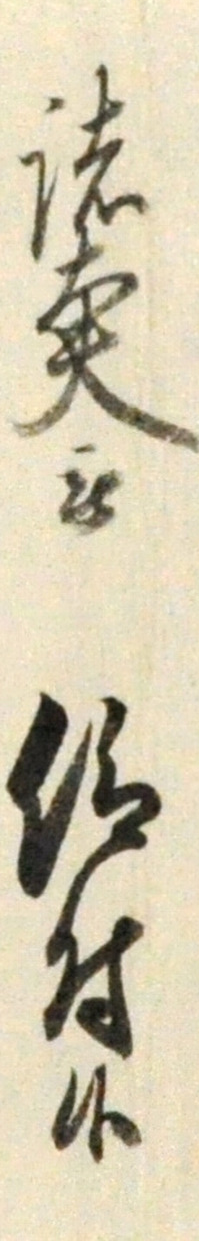諸大夫被仰付候
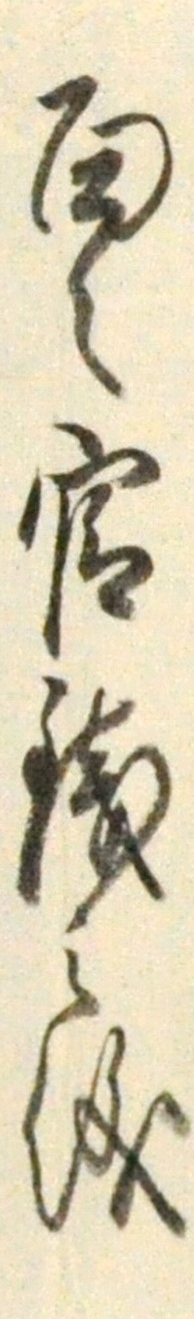面々官銭之儀
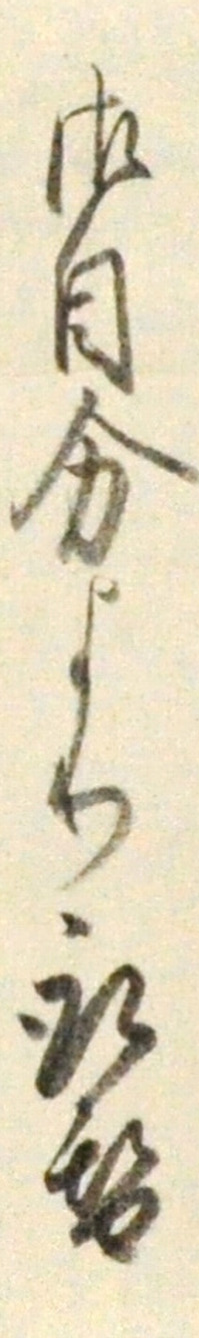御自分より取替
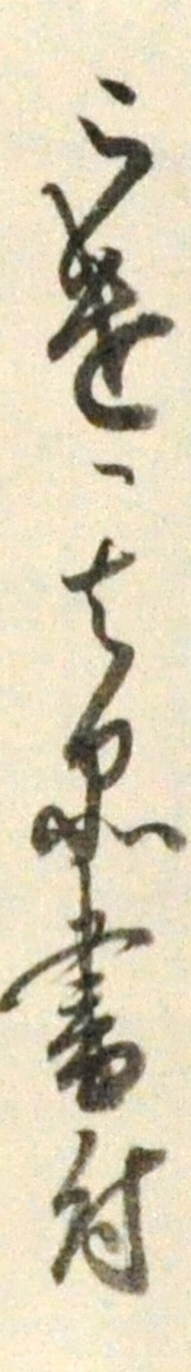被遣其品書付
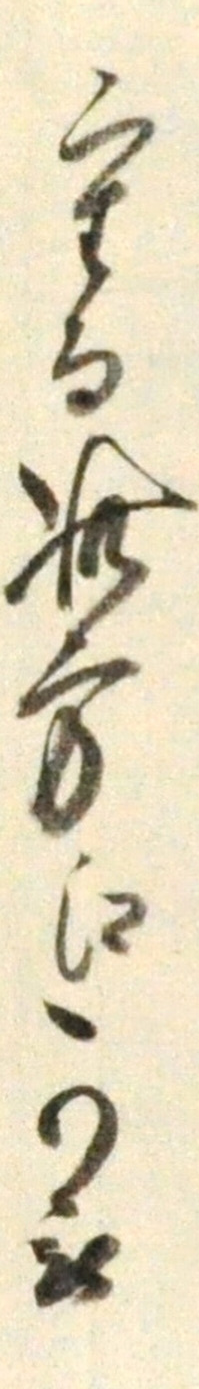重而此方江可被
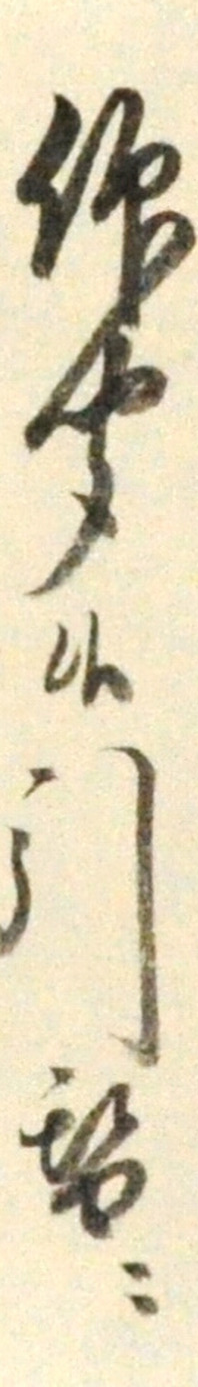仰聞候引替ニ
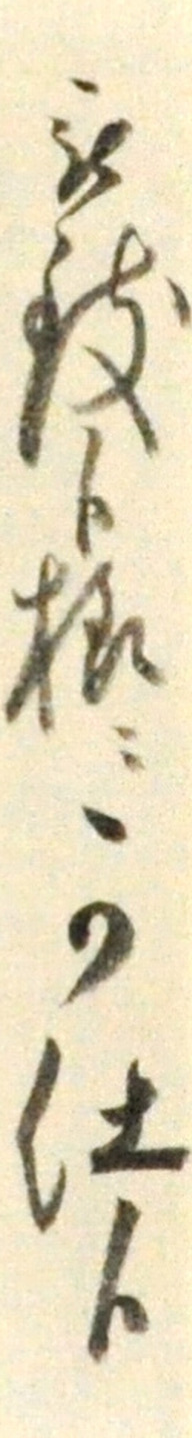被致候様ニ可仕候
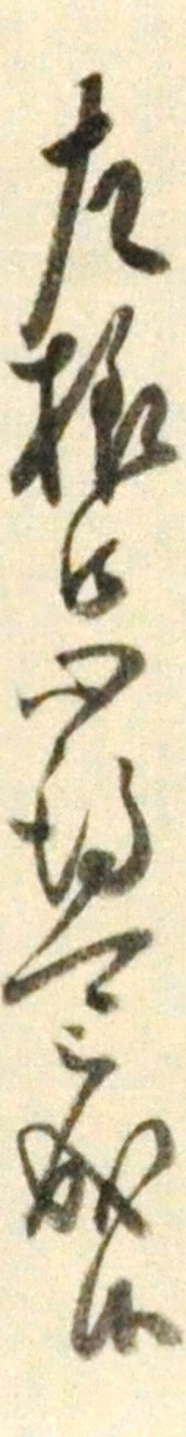左様御心得可被成候
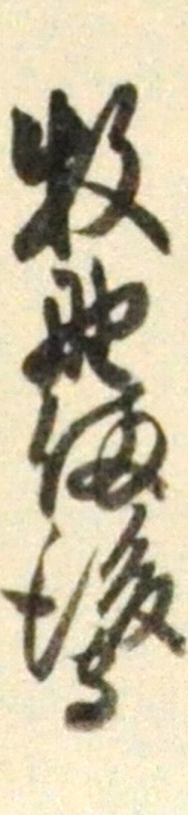牧野備後守
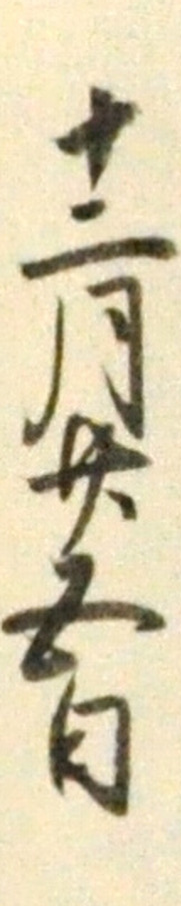十二月廿五日
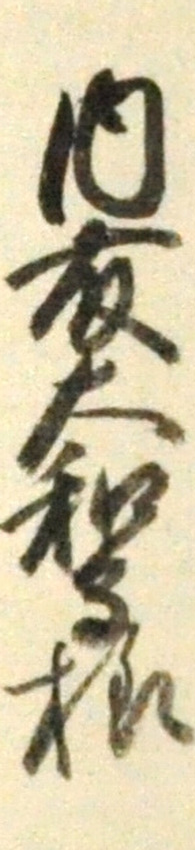内藤大和守様
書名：覚
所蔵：伊那市立高遠町図書館・合同会社AMANE
